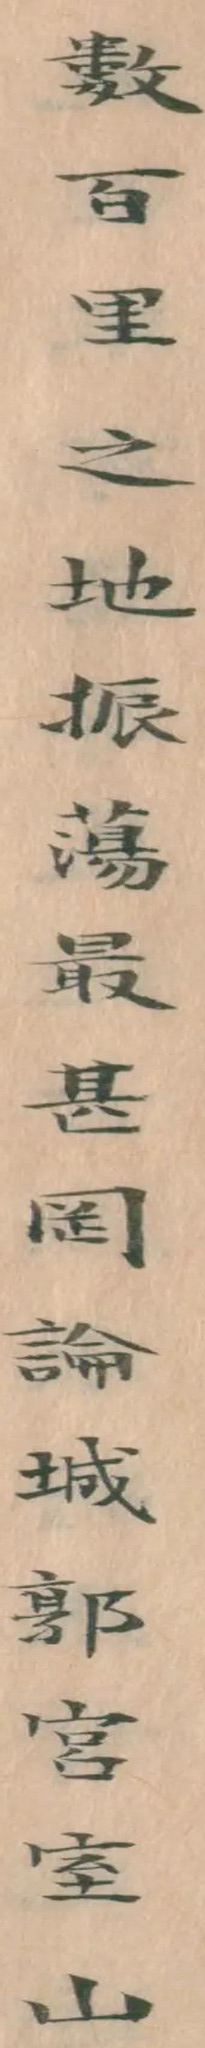数百里之地振最壬岡論城郭宮室山
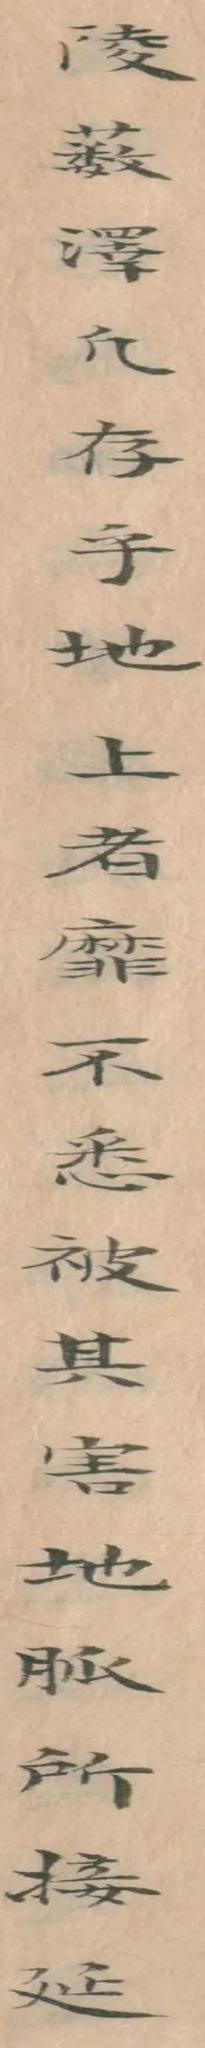陵藪沢凡存孚地上者靡不悉被其害地脈所接延

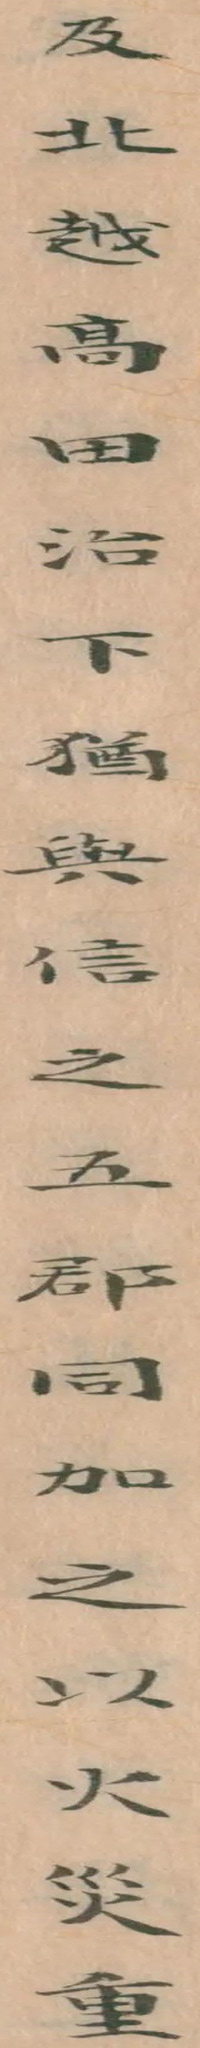及北越高田治下猶輿信之五郡同加之以火災重
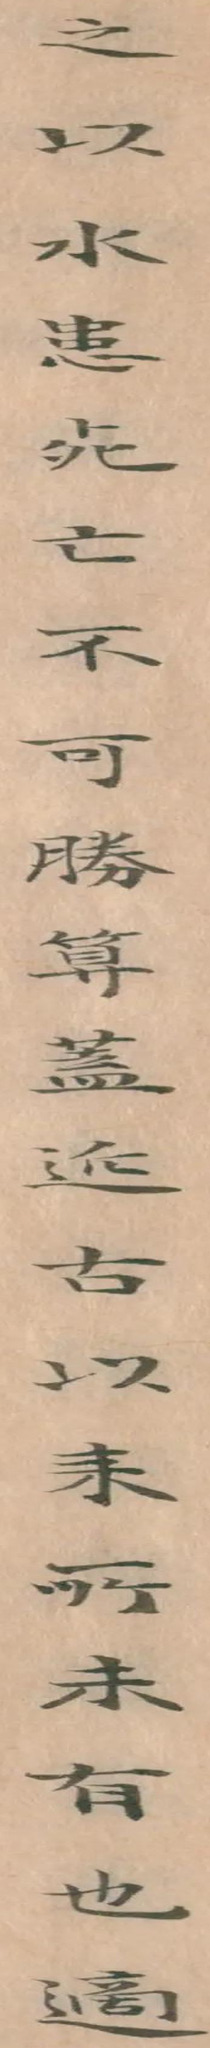之以水患死亡不可勝算蓋近古已来所未有也適
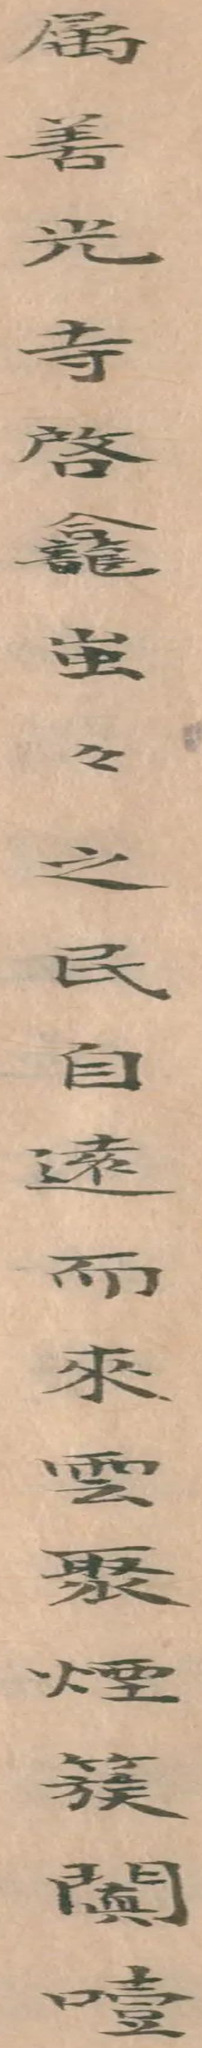属善光寺啓龕蚩々之民自遠而来雲聚煙簇闐噎
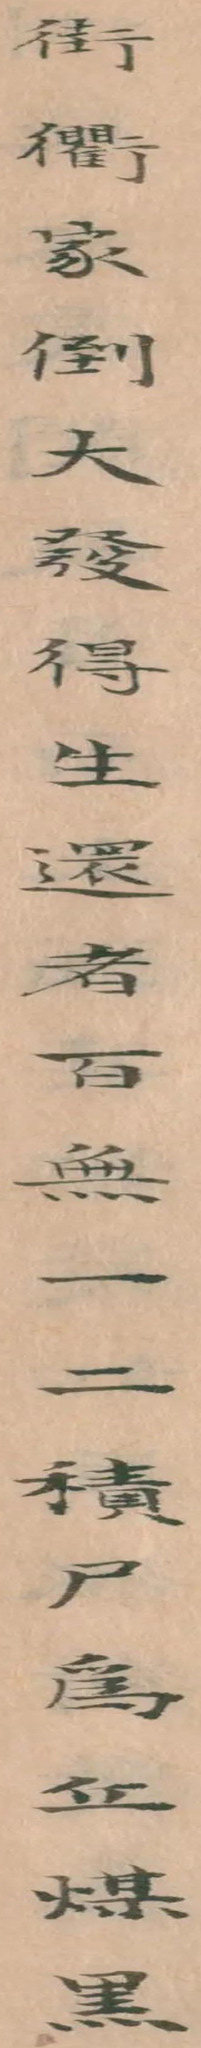街衢家倒大発得生還者百無一二積尸為丘煤黒
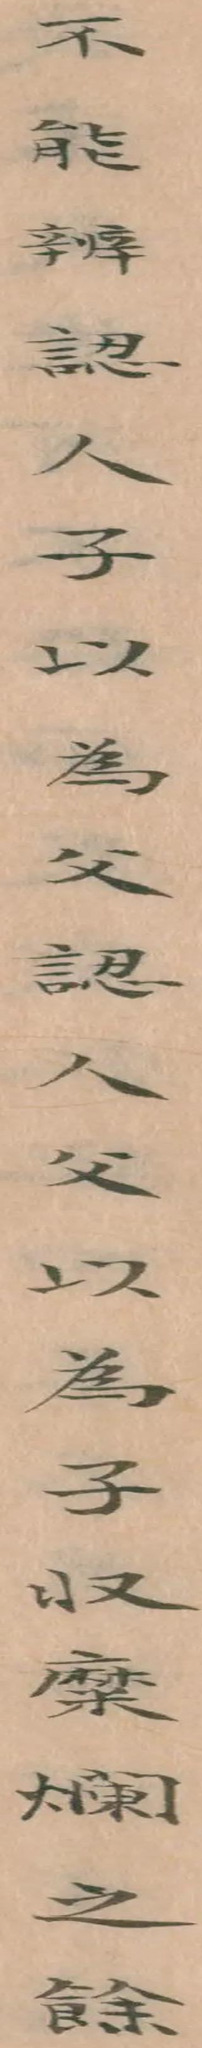不能辨認人子以為父認人父以為子収糜爛之余
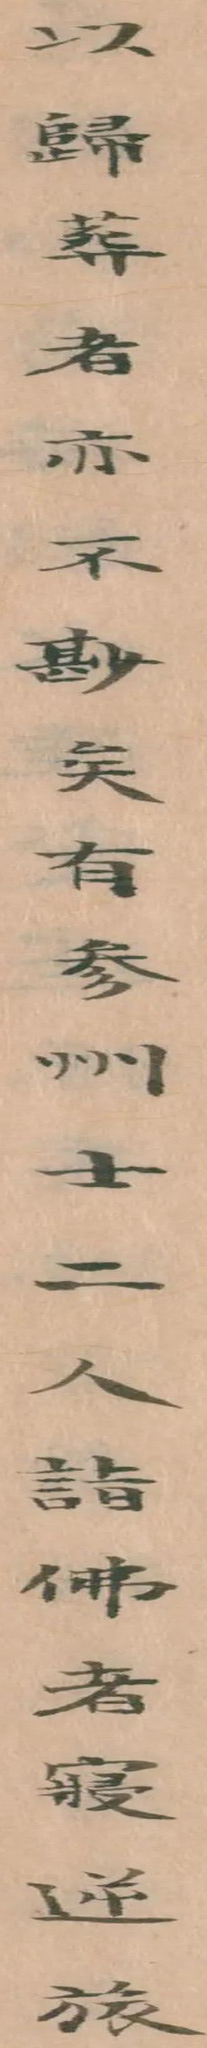以帰葬者亦不尠矣有参州士二人詣仏者寝逆旅
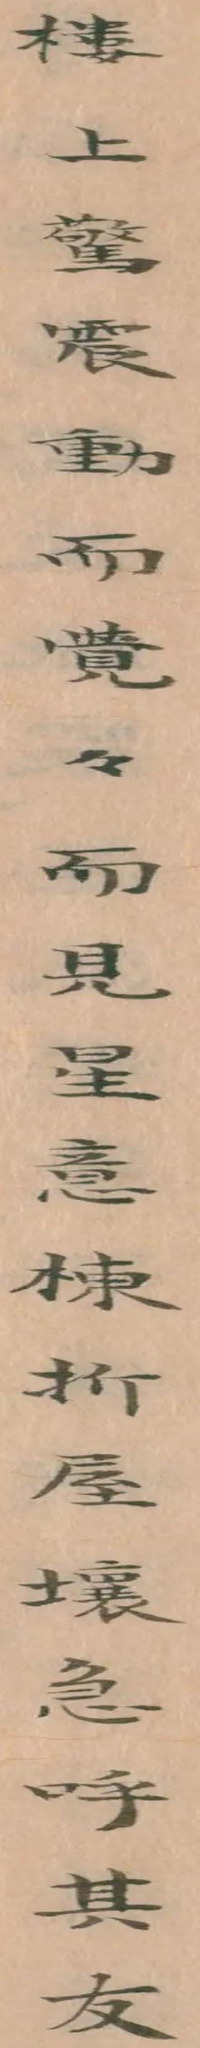樓上驚震動而覚々而見星意棟折屋壊急呼其友
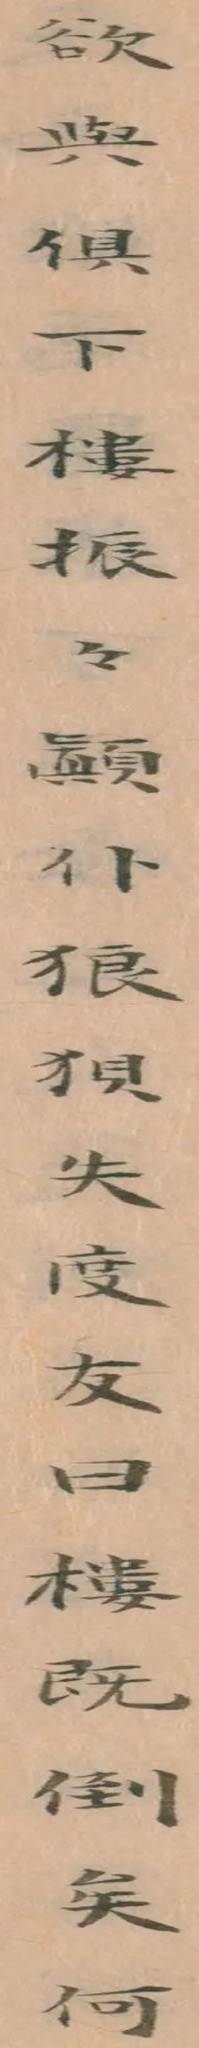欲與俱下楼振々顛仆狼狽失度友曰楼既倒矣何
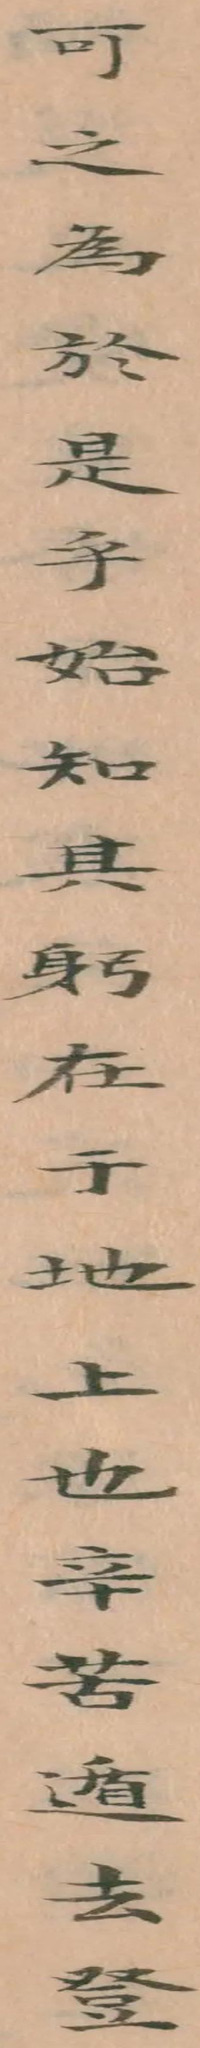可之為於是乎始知其躬在干地上也辛苦遁去登
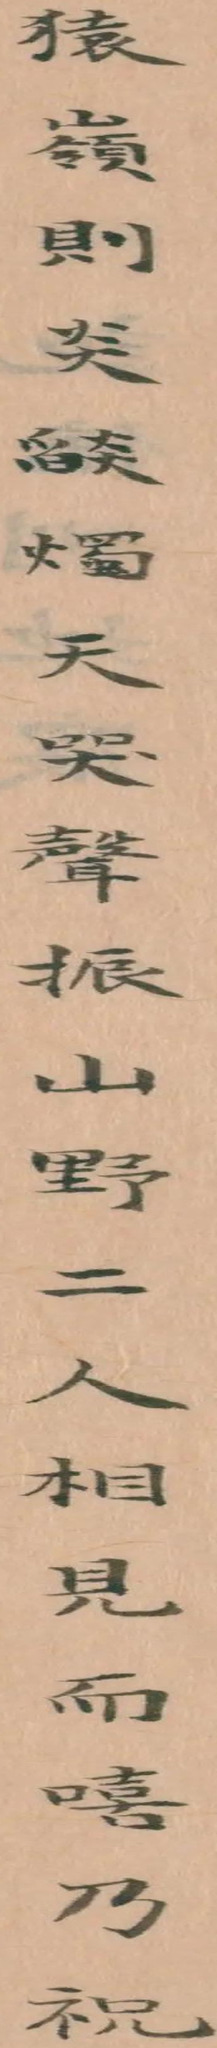猿嶺則炎燄燭天哭声振山野二人相見而暿之祝
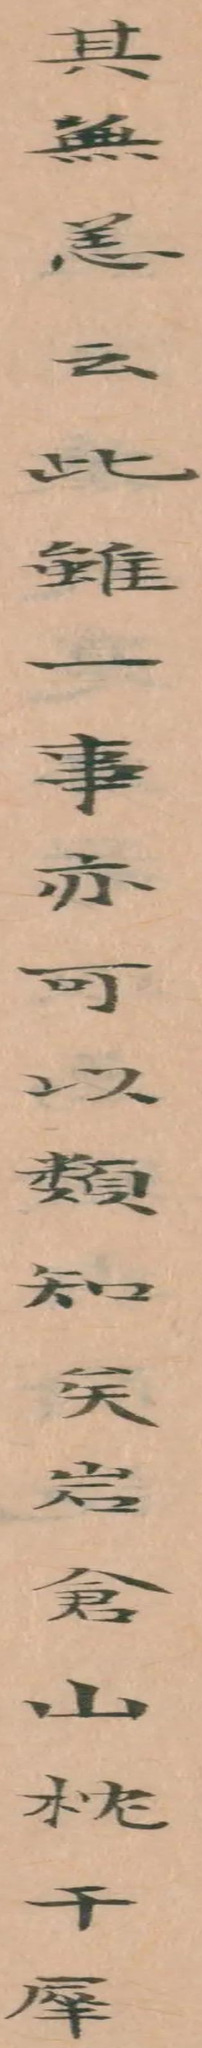其無恙云此雖一事亦可以類知矣岩倉山枕千犀
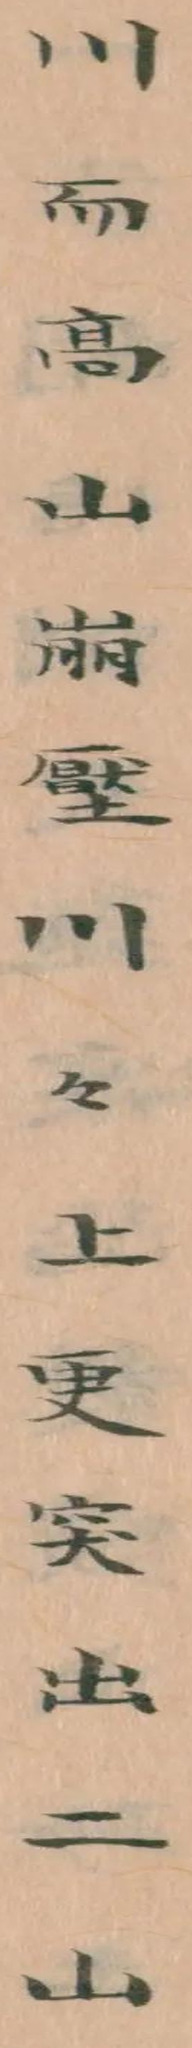川而高山崩壓川々上更突出二山真神
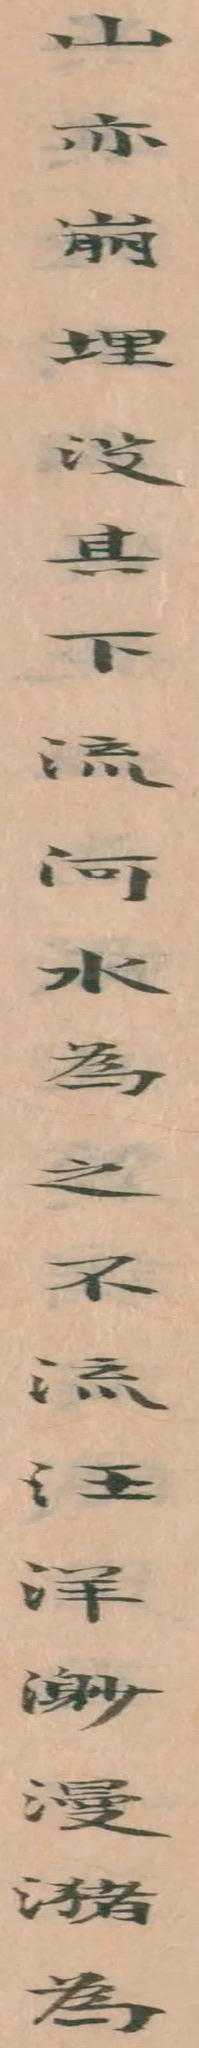山亦崩埋没其下流河水為之不流注洋渺漫潴為
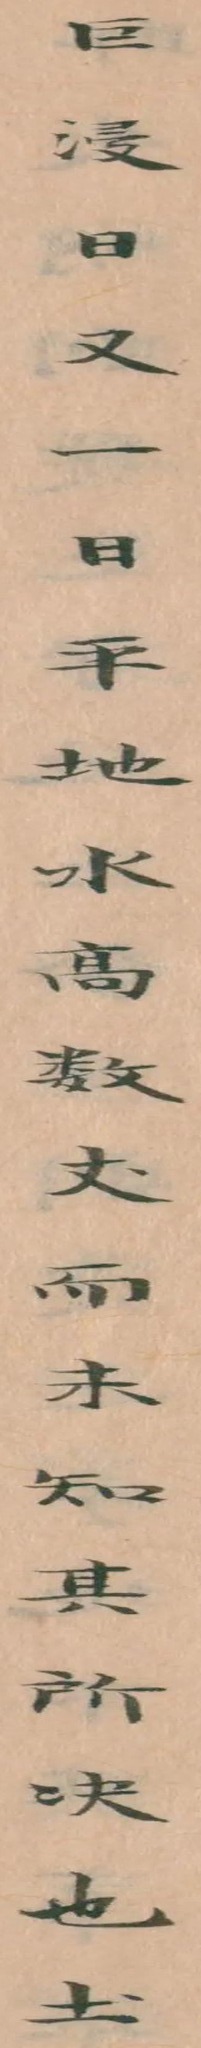巨浸日又一日平地水高数丈而未知其所決也土
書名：地災撮要. 巻1(噴火山・地震ノ部)
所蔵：国立国会図書館 National Diet Library, JAPAN
